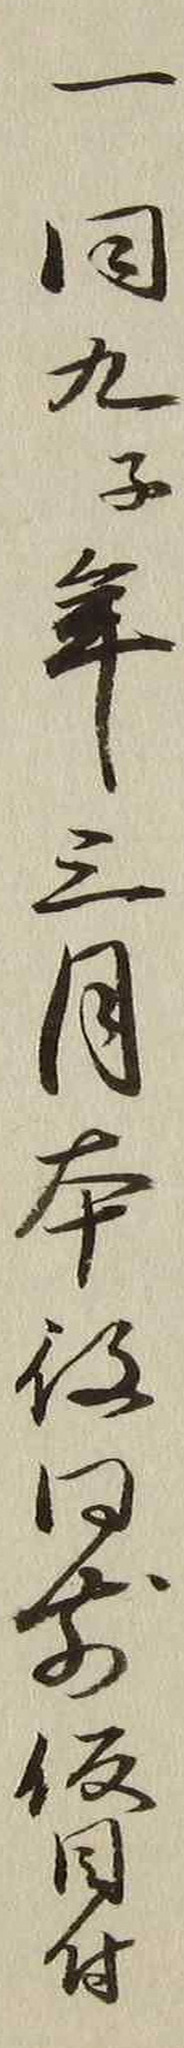一同九子年三月本役同前仮目付
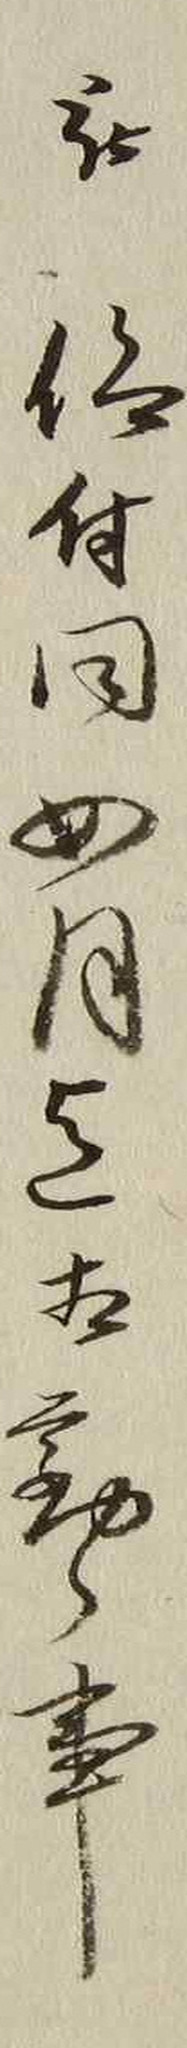被仰付同四月迄相勤候事
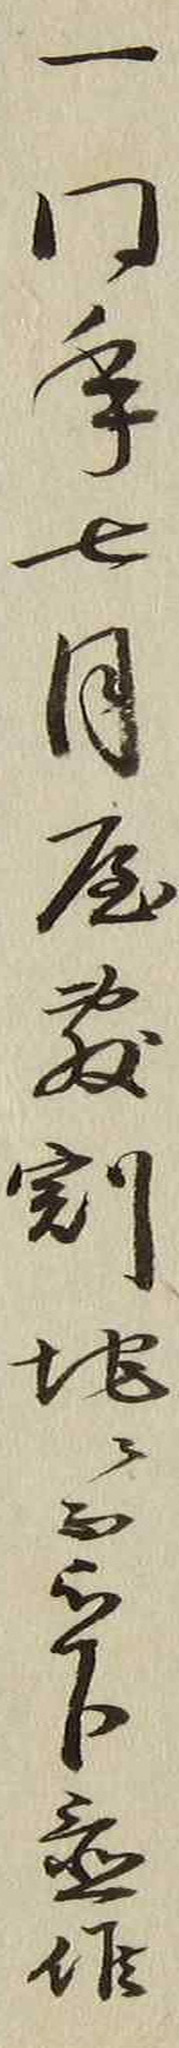一同年七月屋敷割地而被下置候
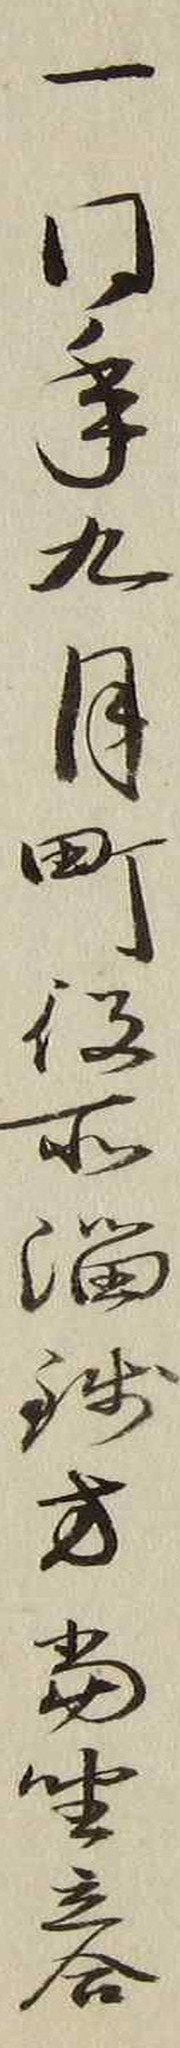一同年九月町役所溜銭方当座立合
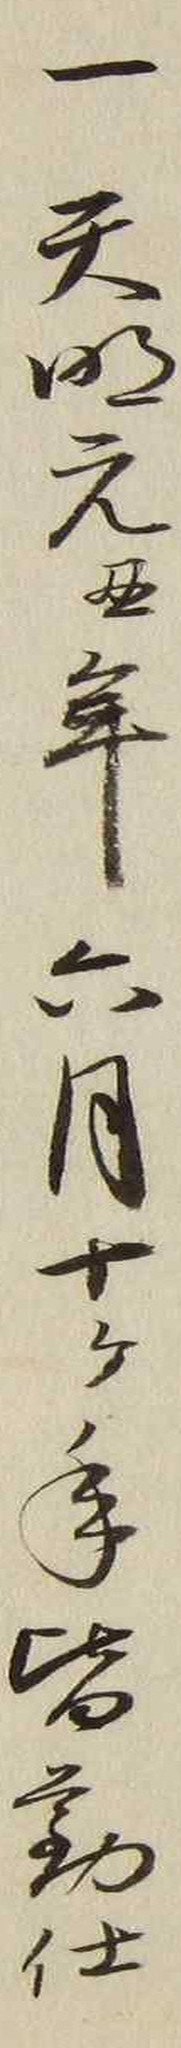一天明元丑年六月十ヶ年皆勤仕
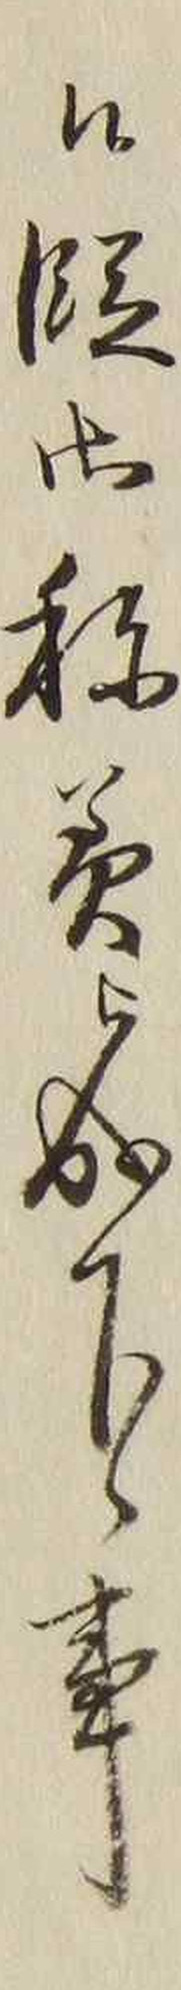候段御称美被成下候事

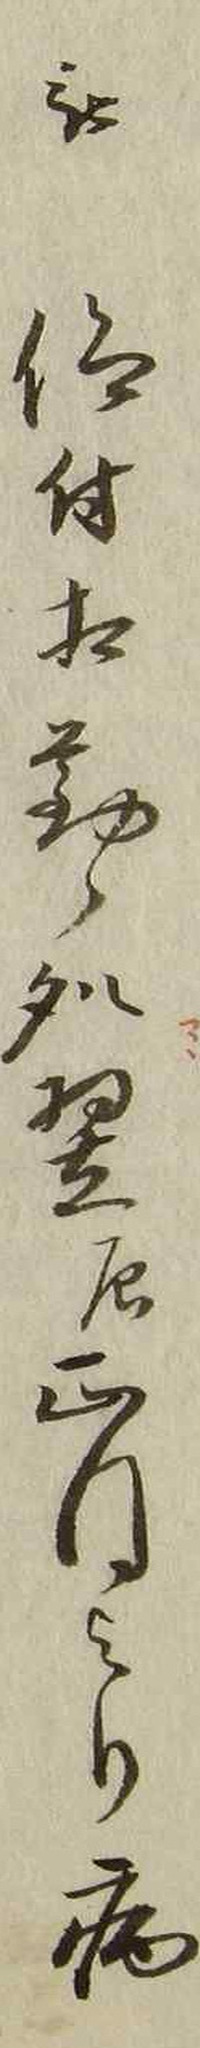被仰付相勤候処翌辰正月より病
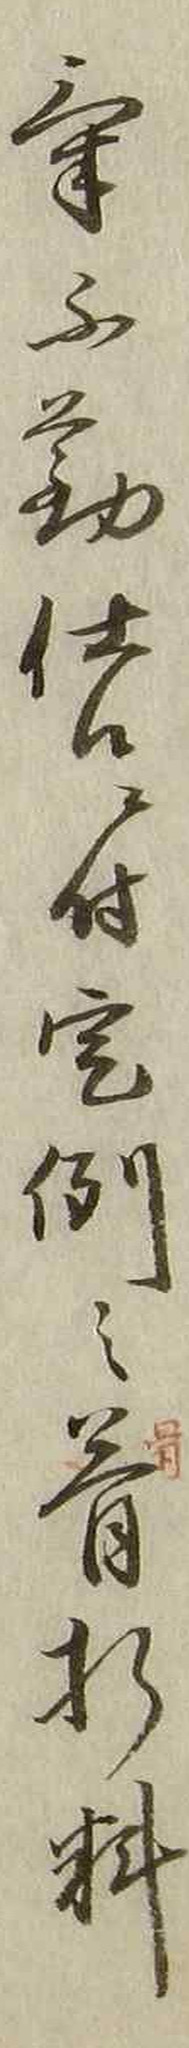気不勤仕候付定例之骨折料
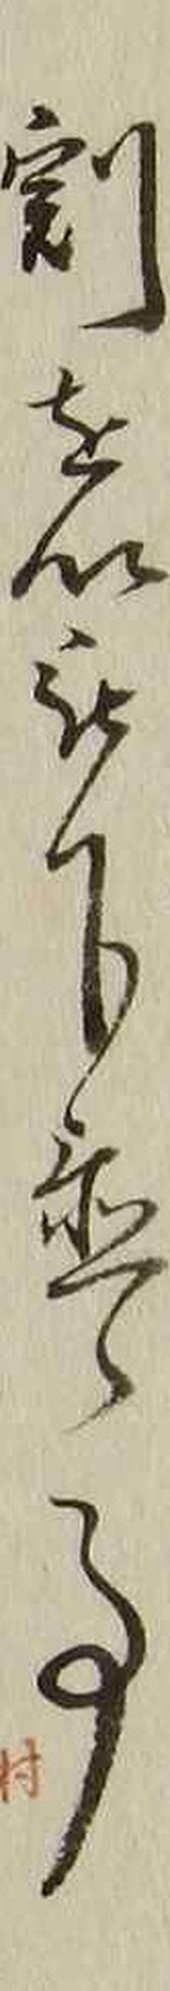割を以被下置候事
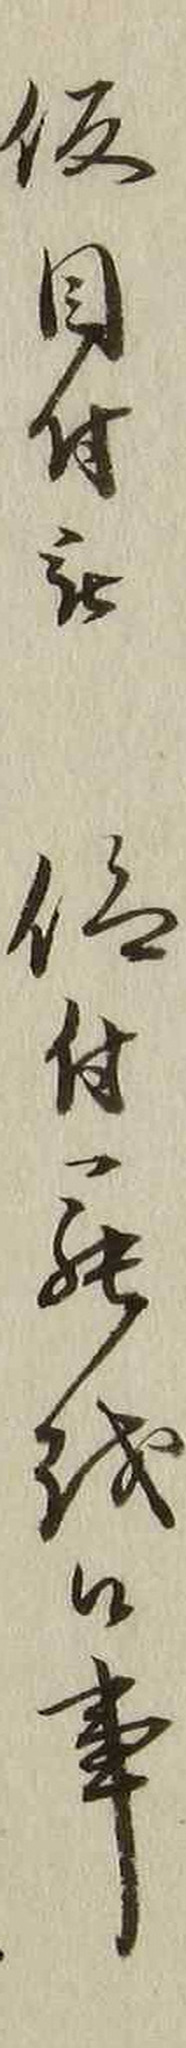仮目付被仰付罷越候事
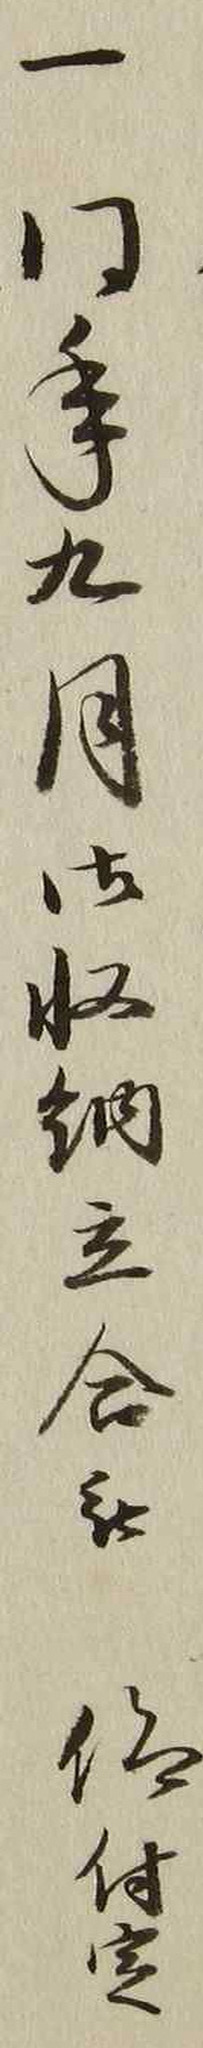一同年九月御収納立合被仰付定
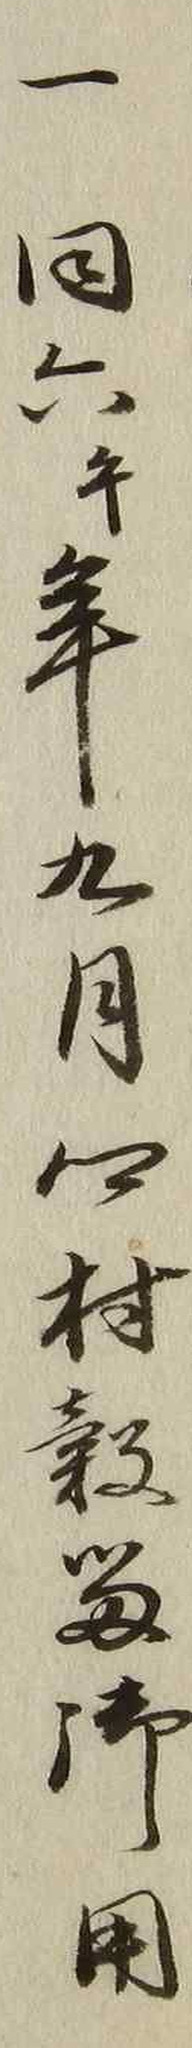一同六午年九月郷村穀留御用
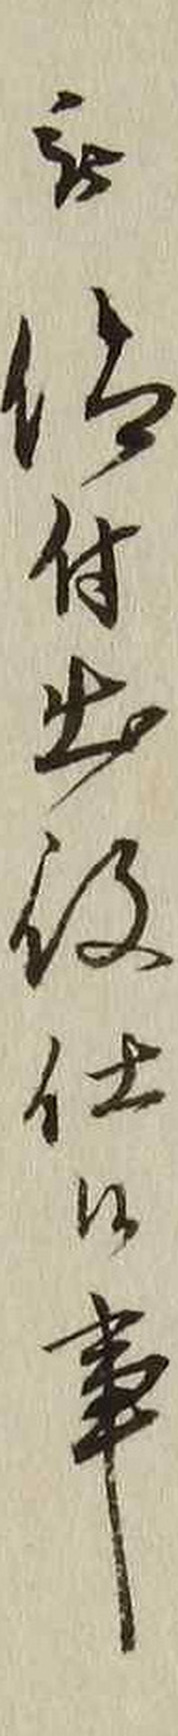被仰付出役仕候事
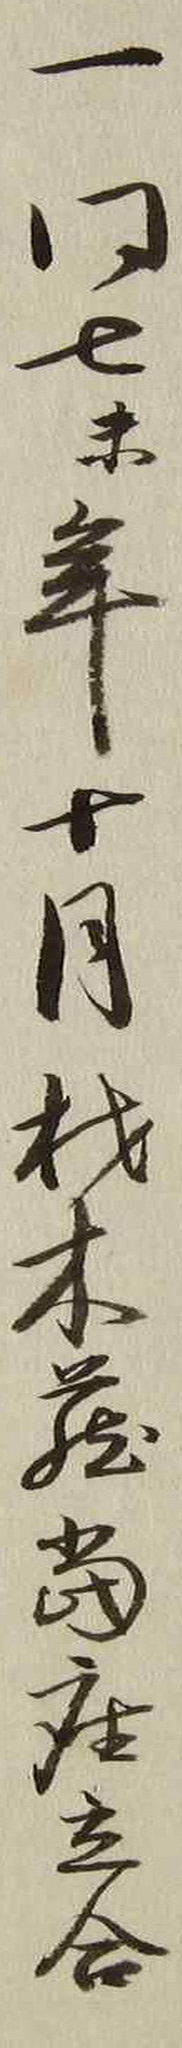一同七未年十月材木蔵当座立合
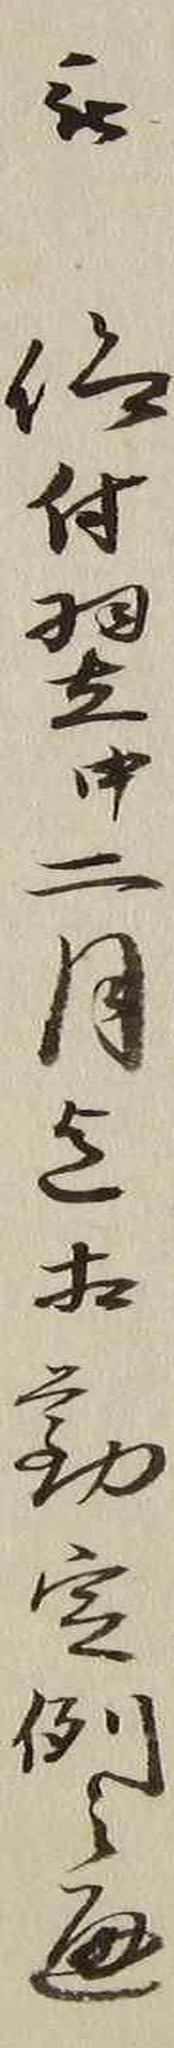被仰付翌申二月迄相勤定例之通
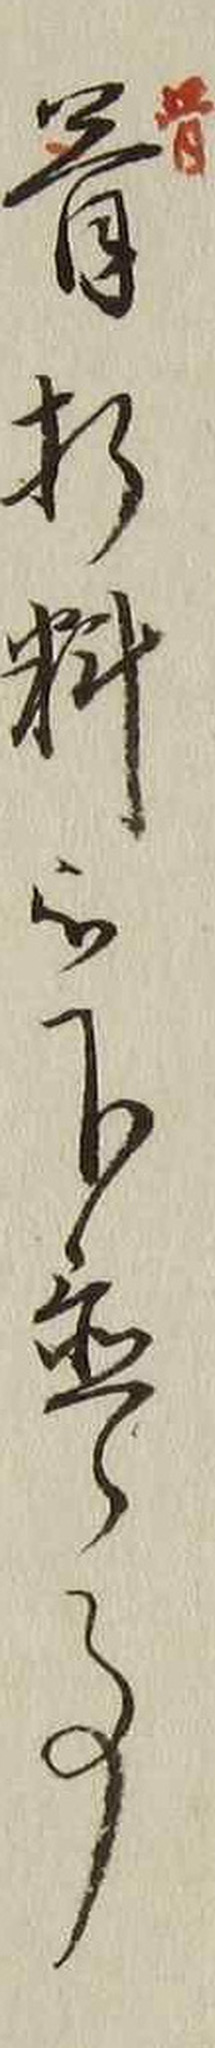割を以被下置候事
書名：諸士系譜　巻之102　か之部10
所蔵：会津若松市立会津図書館
